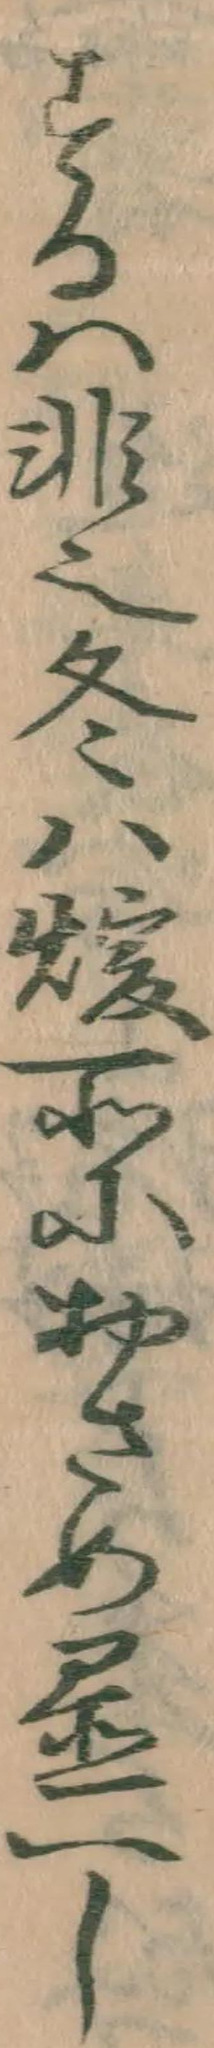するは非也冬は煖所におさめ置へし
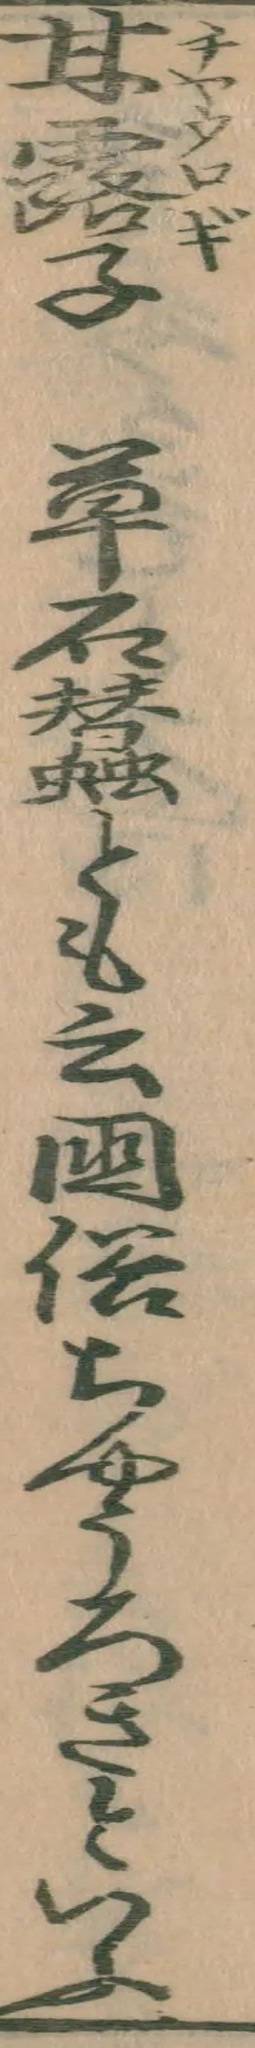甘露子草石蠺とも云国俗ちゆうろきといふ
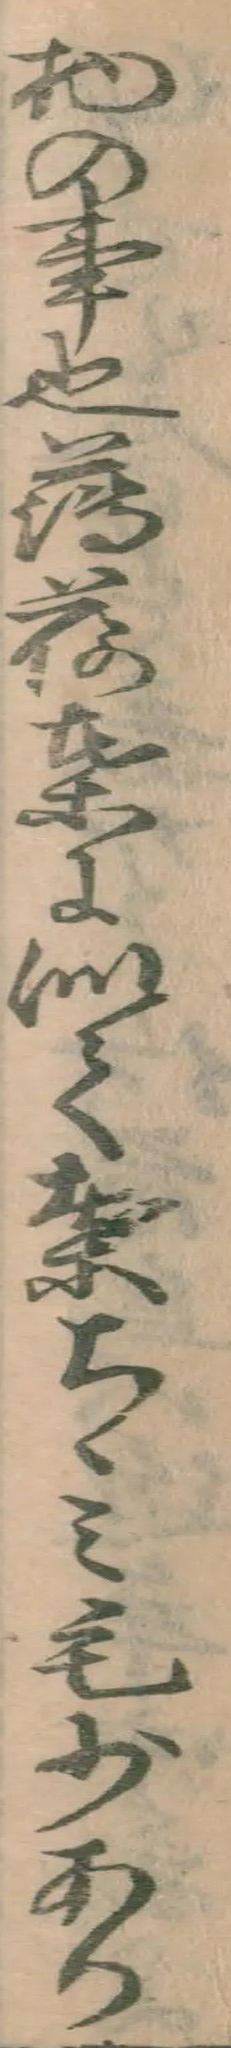物の事也落荷葉に似て葉ちゝみ毛少あり
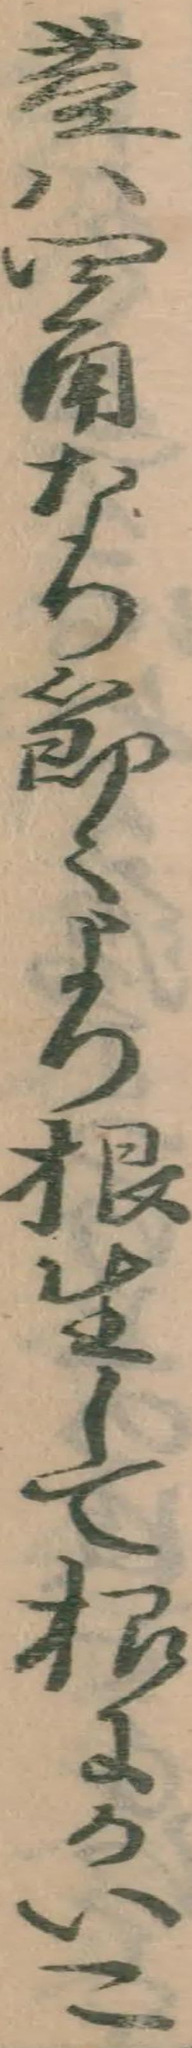茎は四角なり節々より根生して根にかいこ
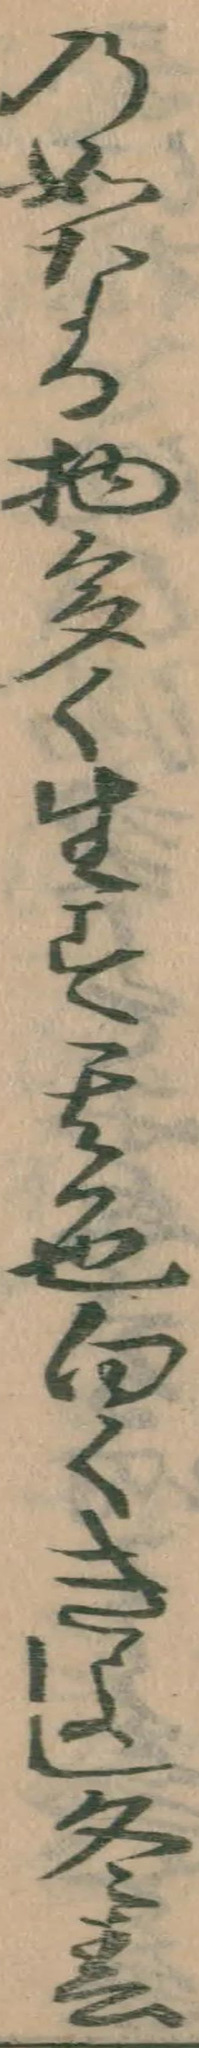の如なる物多く生す其色白くきよし冬春
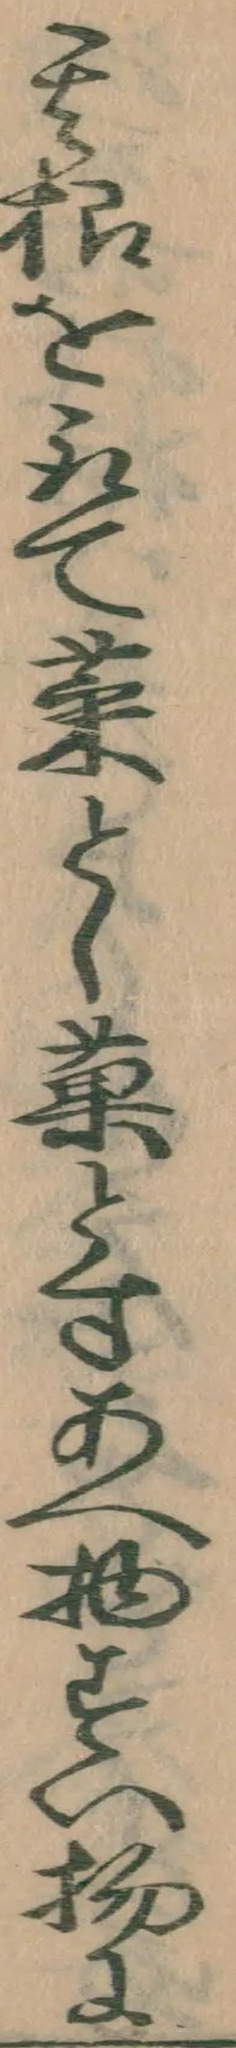其根を取て菜とし菓とすあへ物すい物に
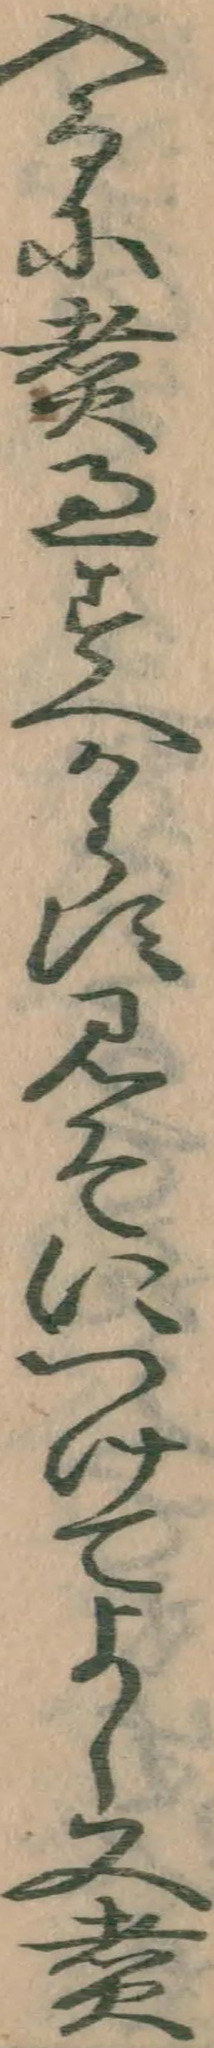入るに煮過すへからすみそにつけてよし又煮
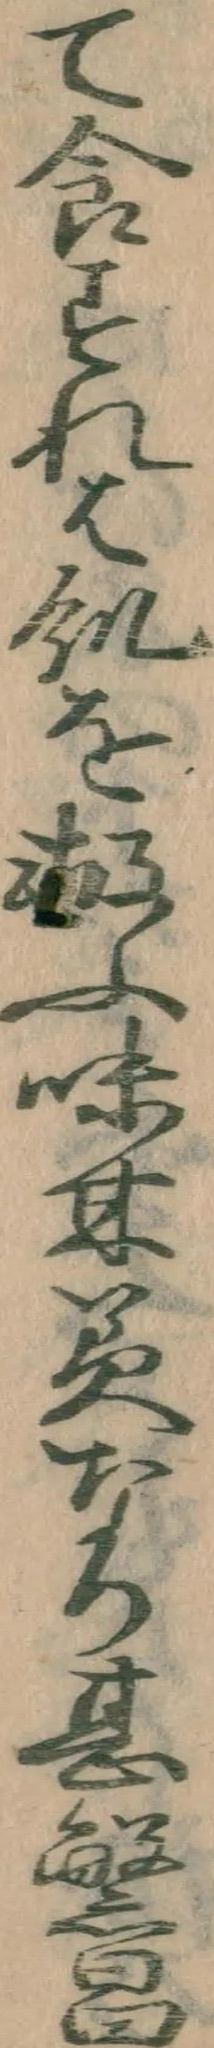て食すれは飢を救ふ味甘美なり甚繁昌
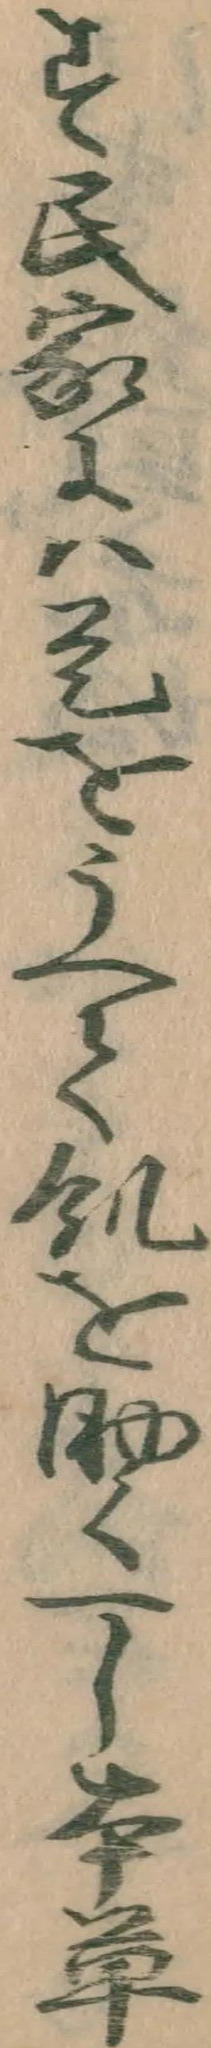す民家には是をうへて飢を助くへし本草
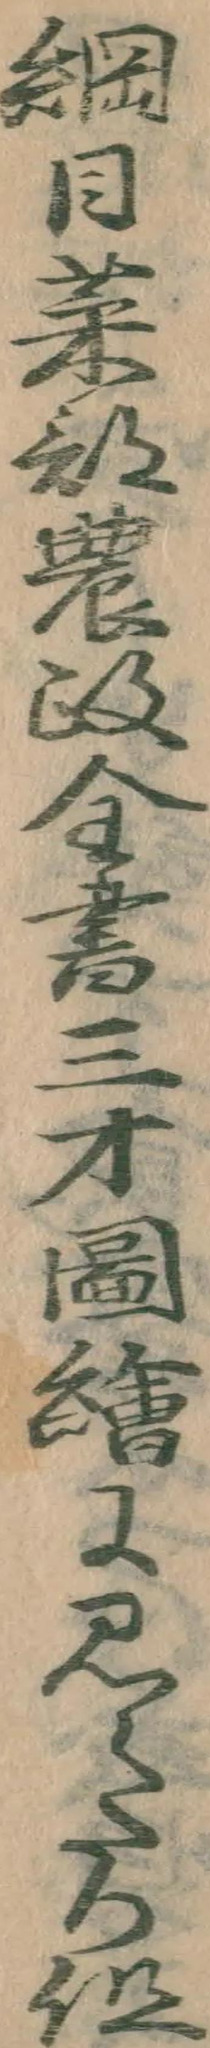綱目菜部農政全書三才図絵に見たり但
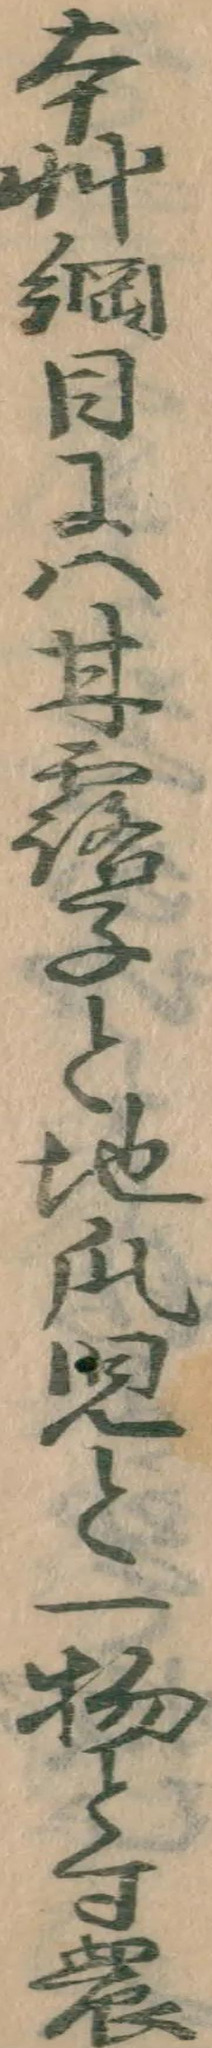本艸綱目には甘露子と地瓜児と一物とす農
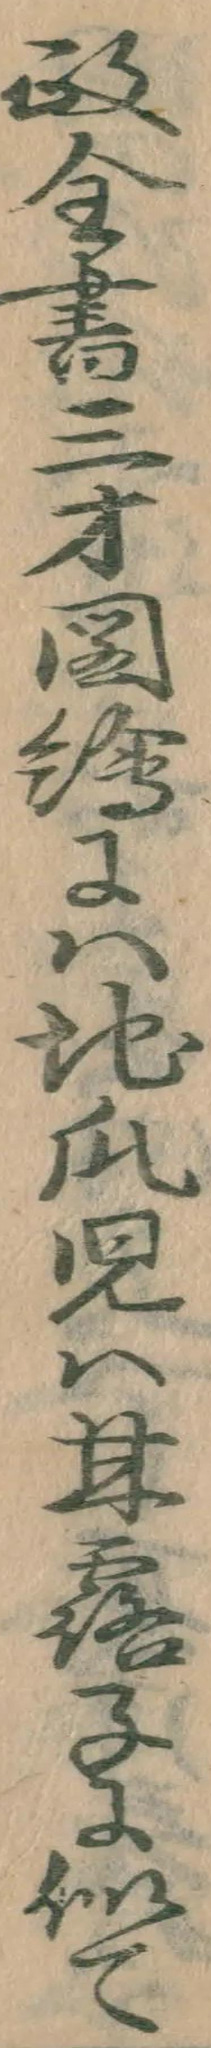政全書三才図絵には地瓜児は甘露子に似て
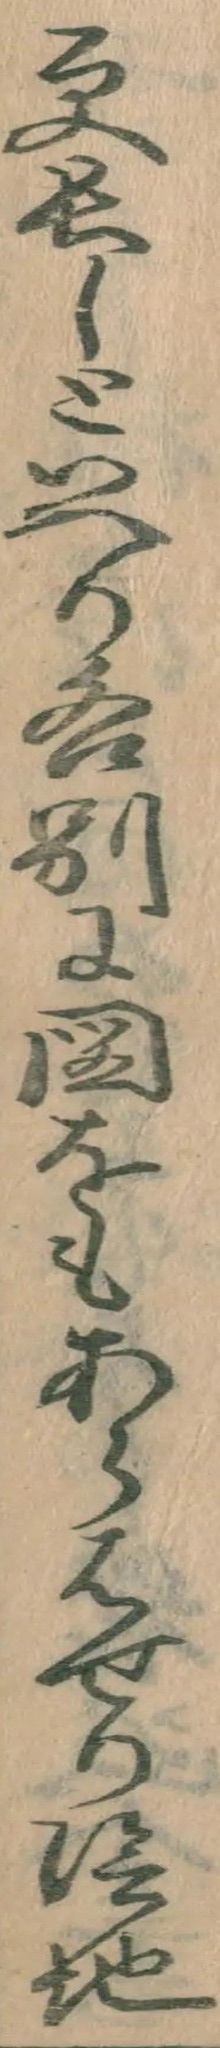更長しといへり各別に図をもあらはせり陰地

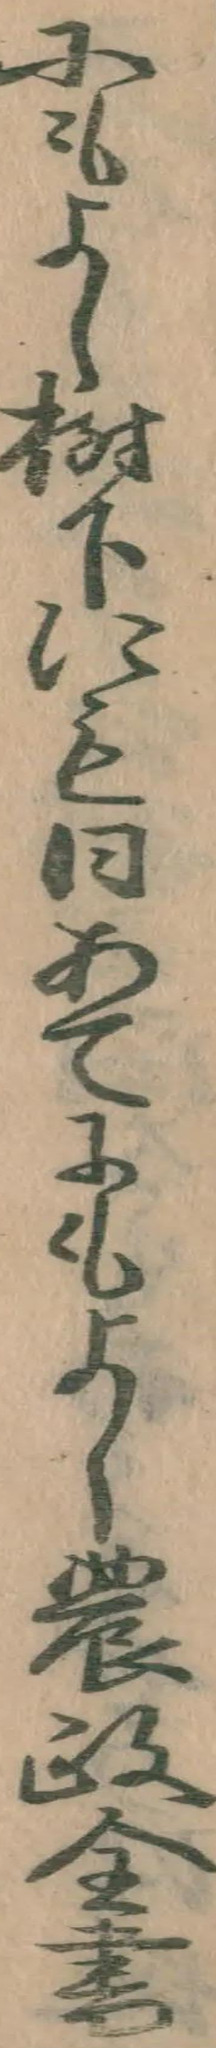にもよし樹下にも日あてにもよし農政全書
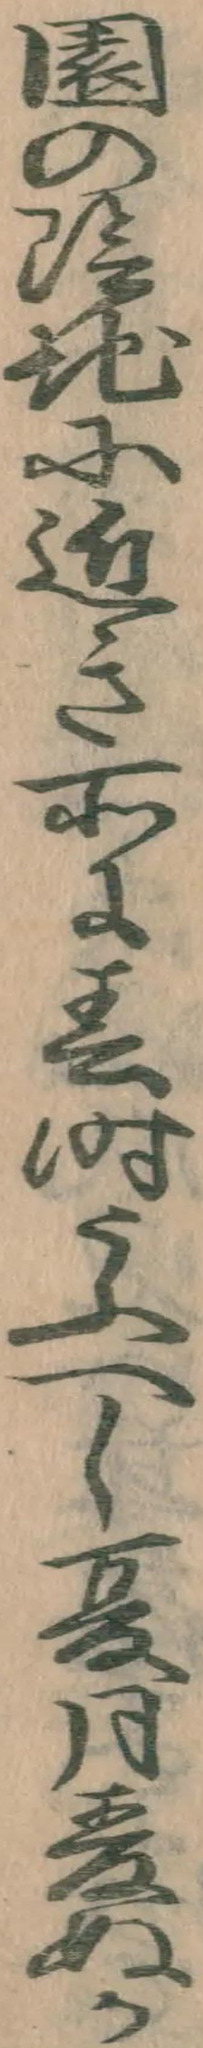園の陰地に近き所に春時うふへし夏月麦ぬか
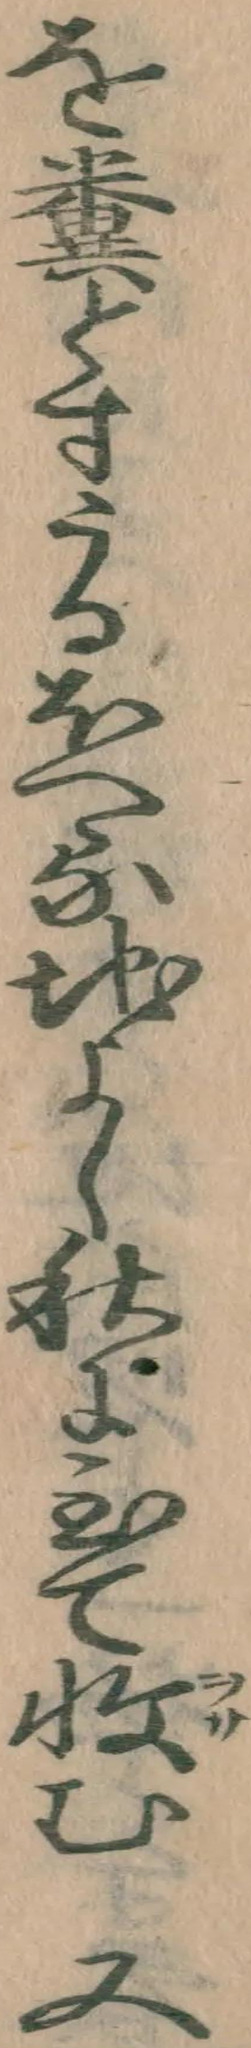を糞とすうるほへる地よし秋に至て収む又
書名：菜譜 3巻
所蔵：国立国会図書館 National Diet Library, JAPAN
